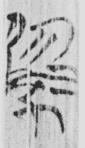溺（弱）
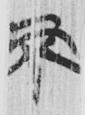不
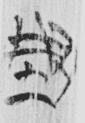○（刑）
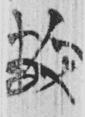○（畝）
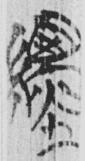纆
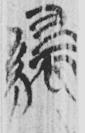○（短）
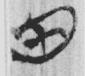田
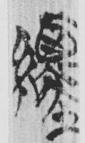纆
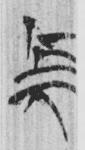長
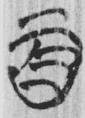百
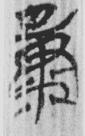糧
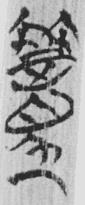箽
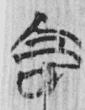命
